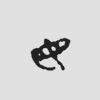母
